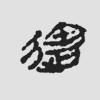達
